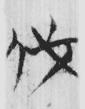伐
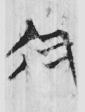今
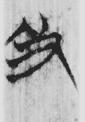及
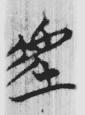𫊟
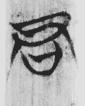君
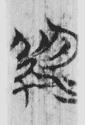溺
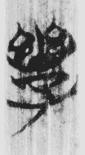{幽子}
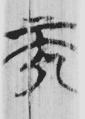而
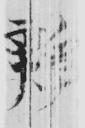{辛㠯子}
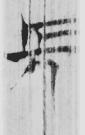長
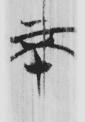不
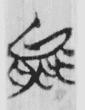能
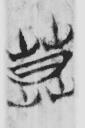莫
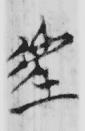𫊟
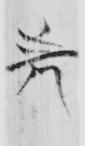先
